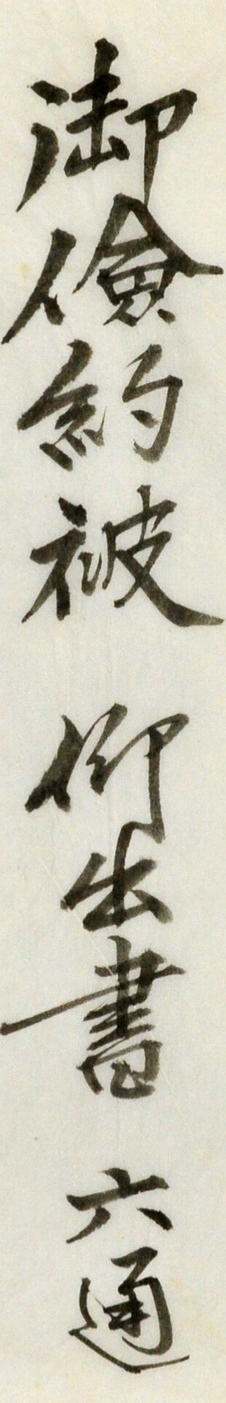御倹約被仰出書六通

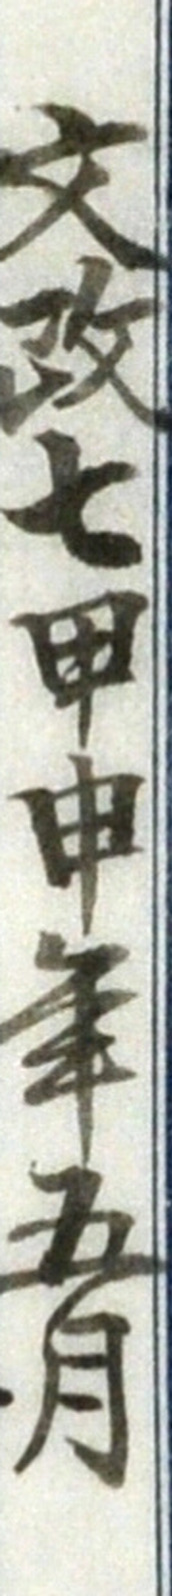文政七甲申年五月
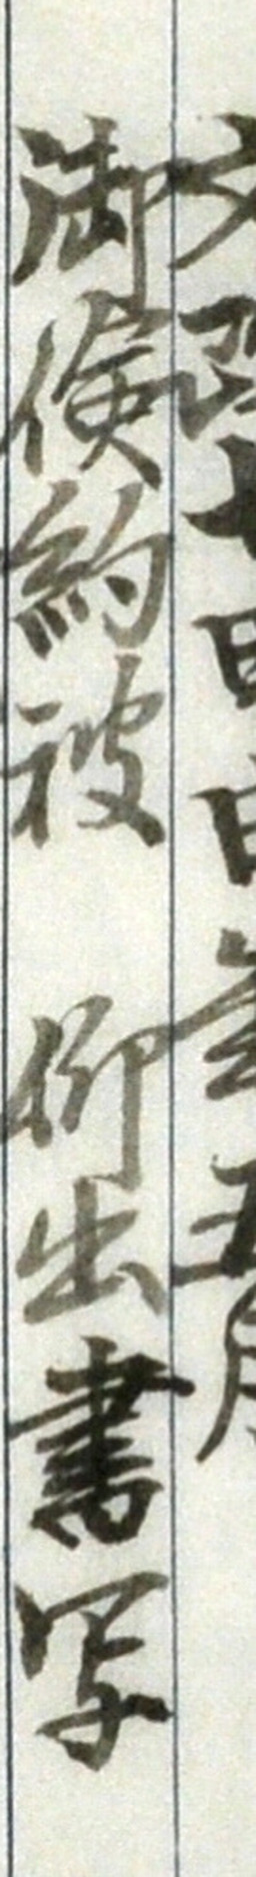御倹約被仰出書写
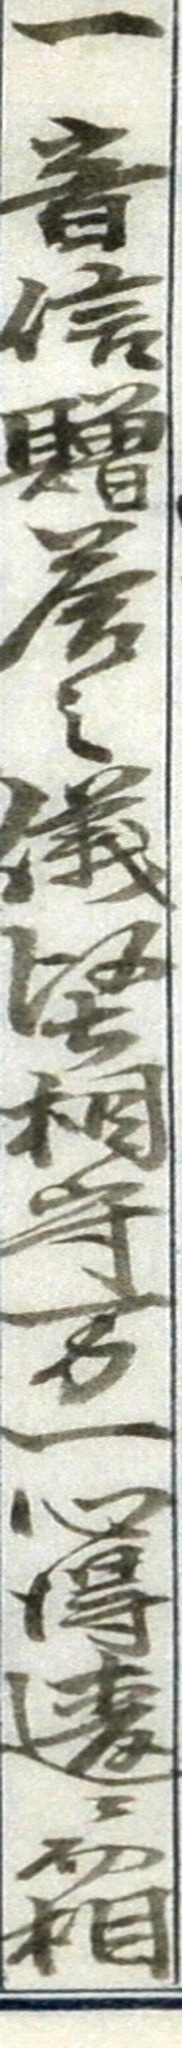一音信贈答之儀堅相守万一心得違ニ而相
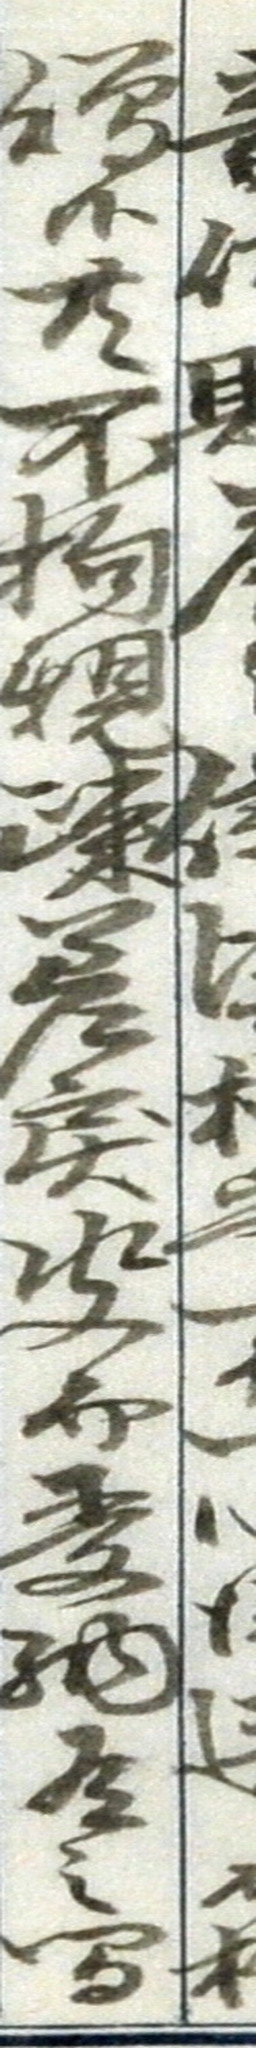贈候共不拘親疎差戻決而受納有之間
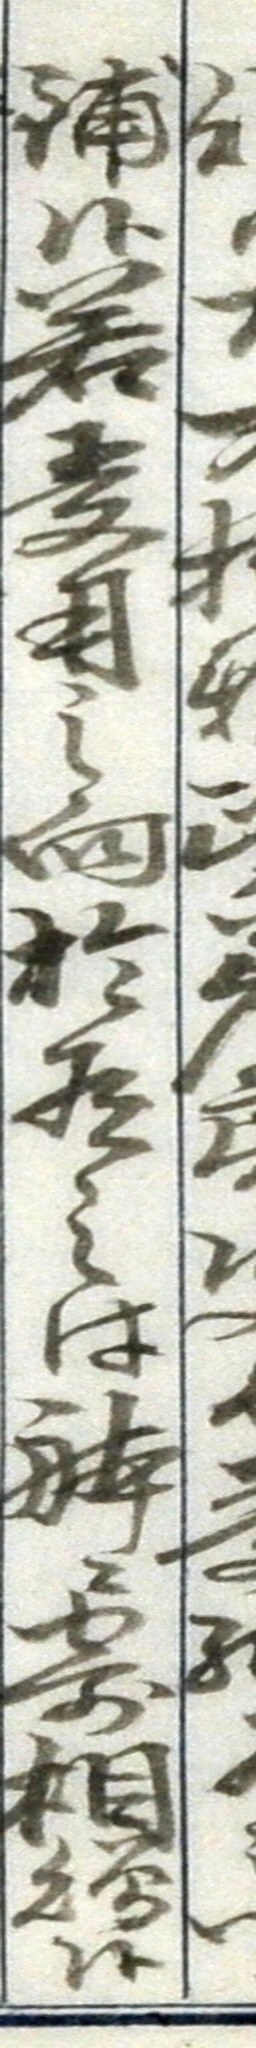鋪候若受用之向於有之は躰ニ寄相贈候
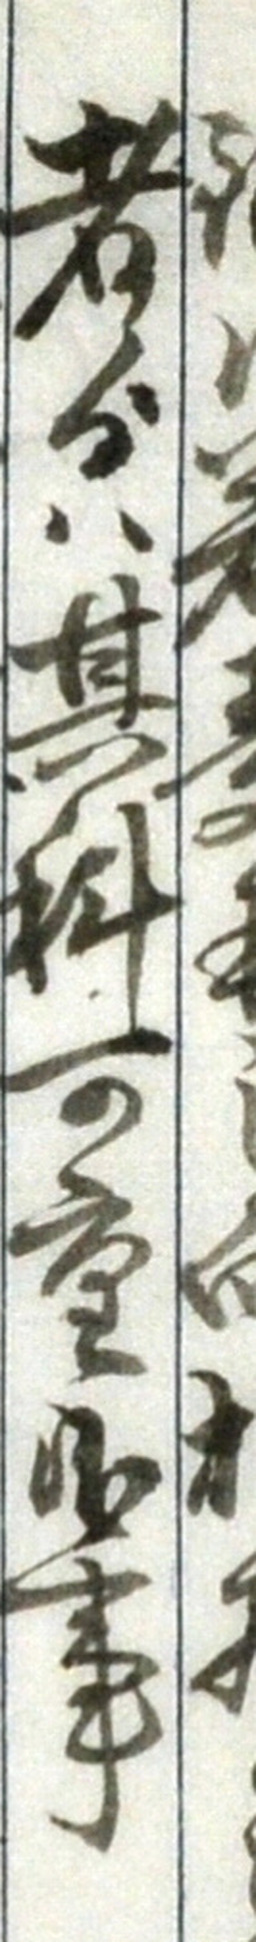者ゟは其科可重候事
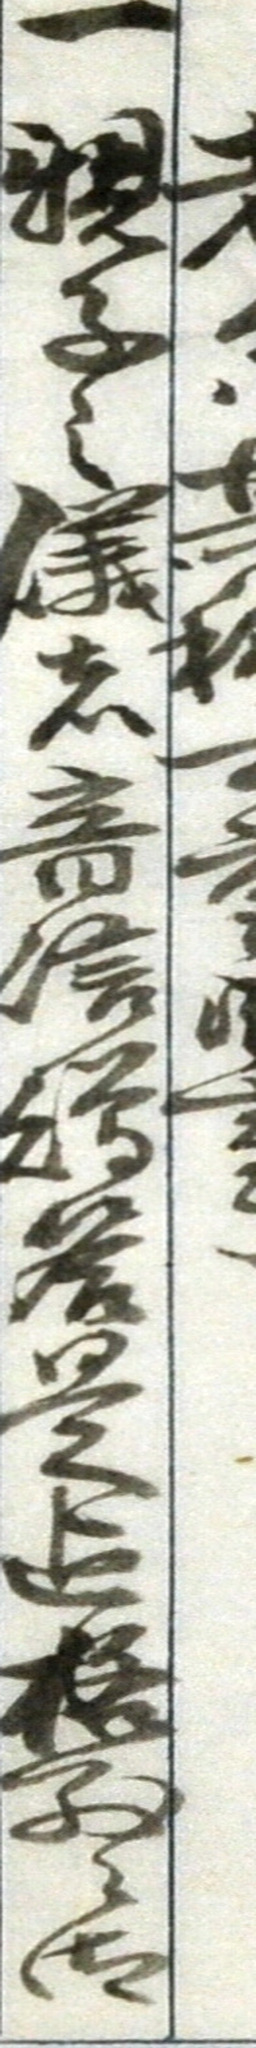一親子之儀は音信贈答是迄格別之御
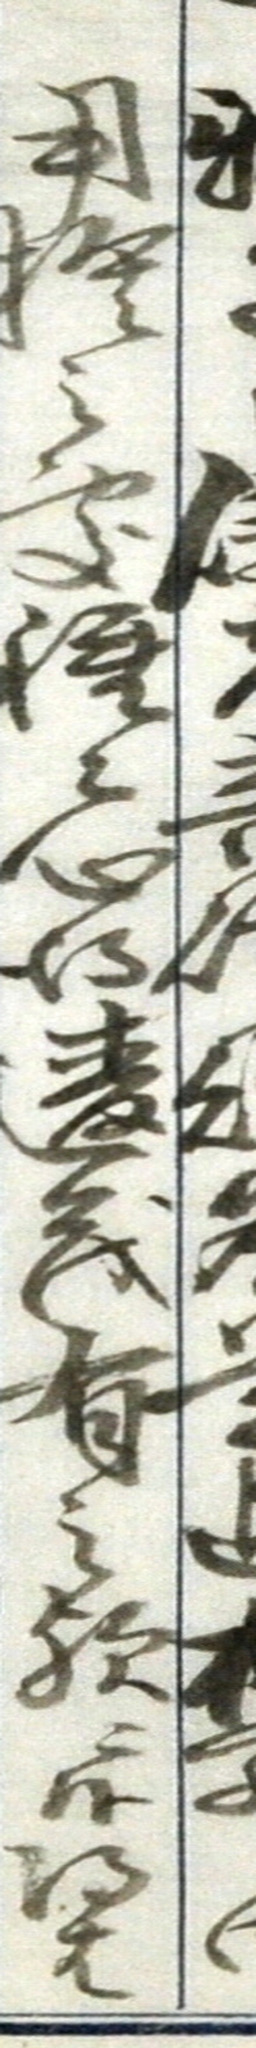用捨之処種々心得違も有之欤ニ候得は
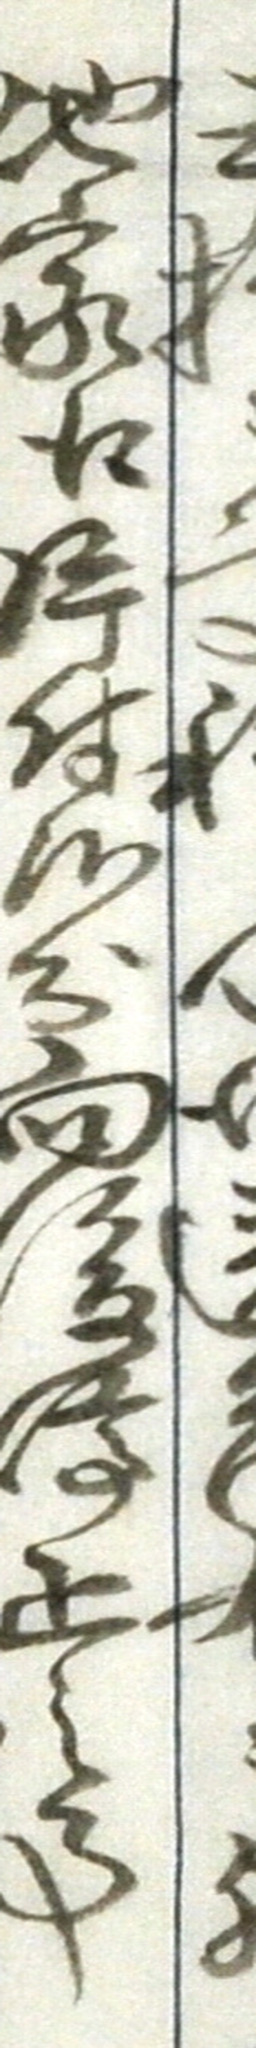他家え片付候分向後停止之事
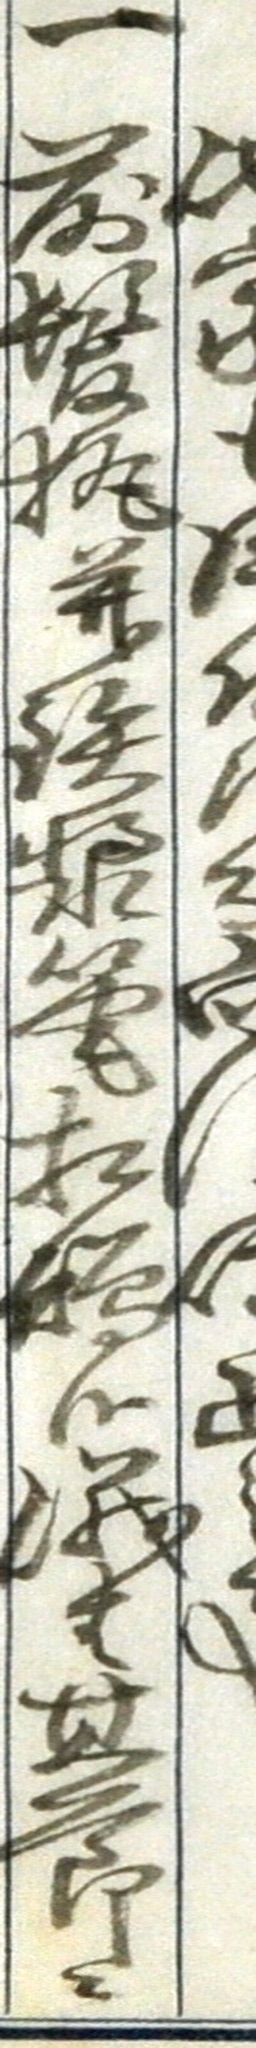一前髪執并鉄漿筆相贈候儀は其節ニ
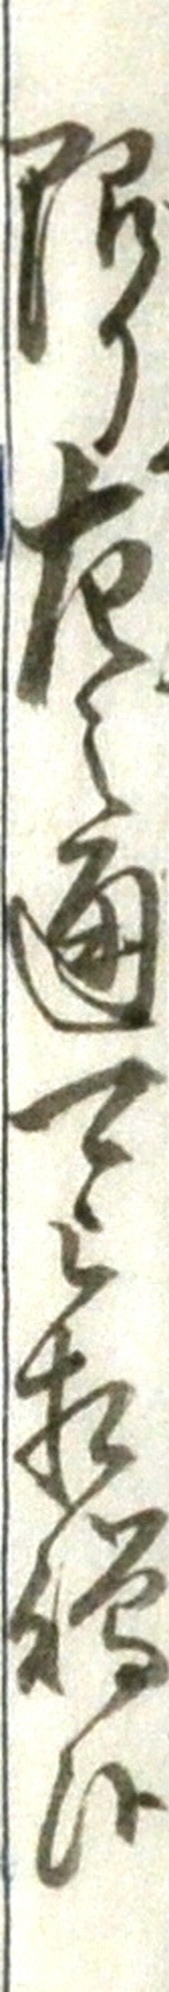限り左之通可被相贈候

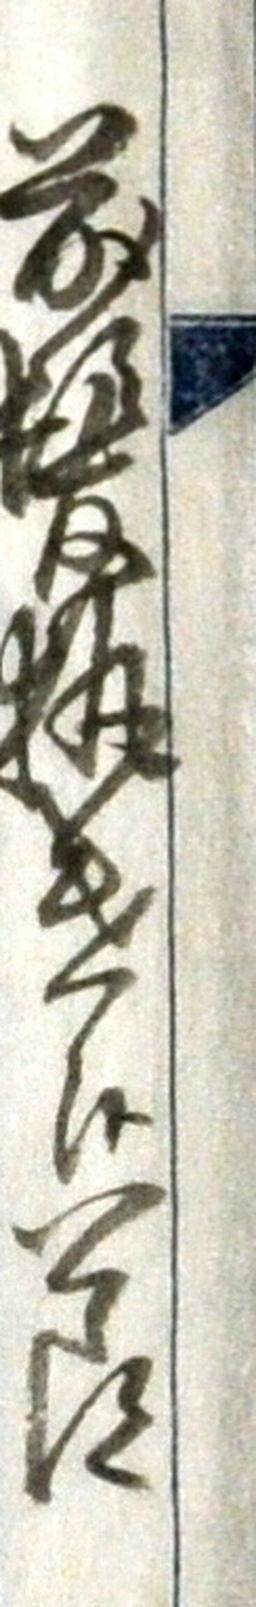前髪執遣候節
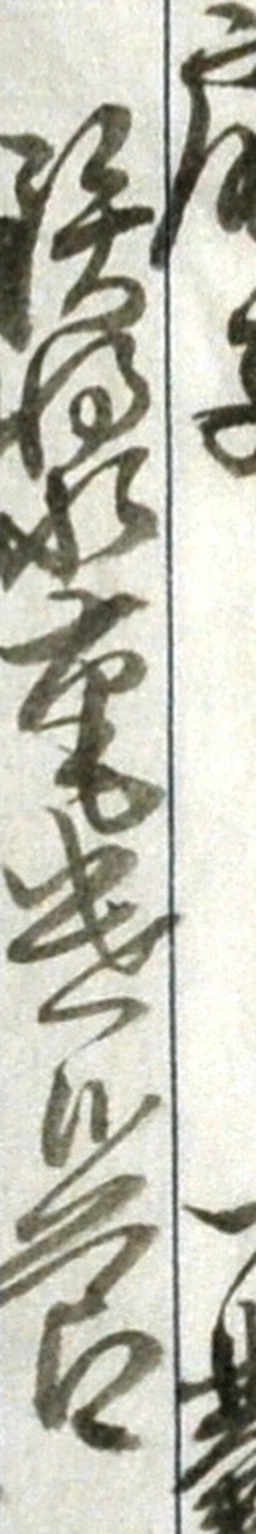鉄漿筆遣候節
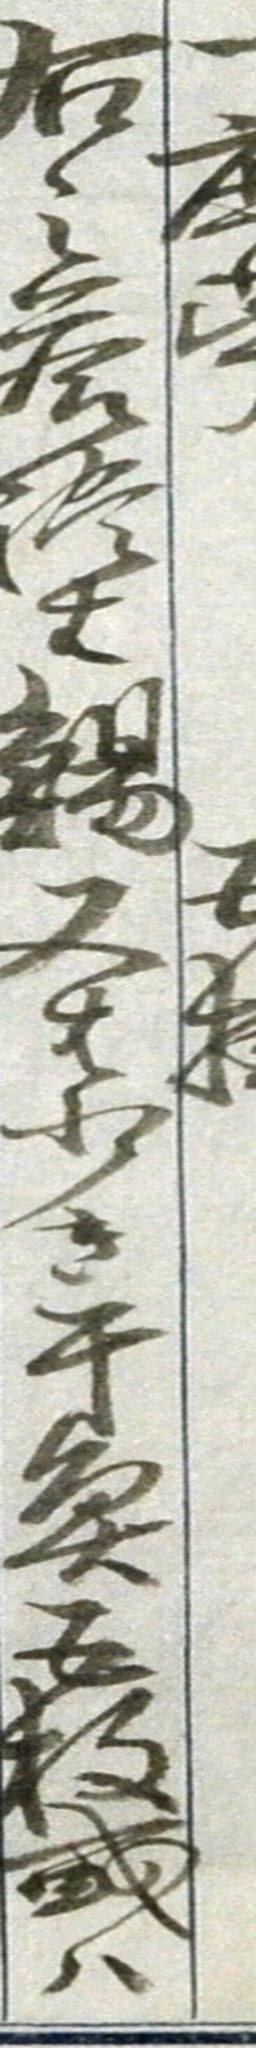右之答礼は鯣又は少き干魚五枚或は
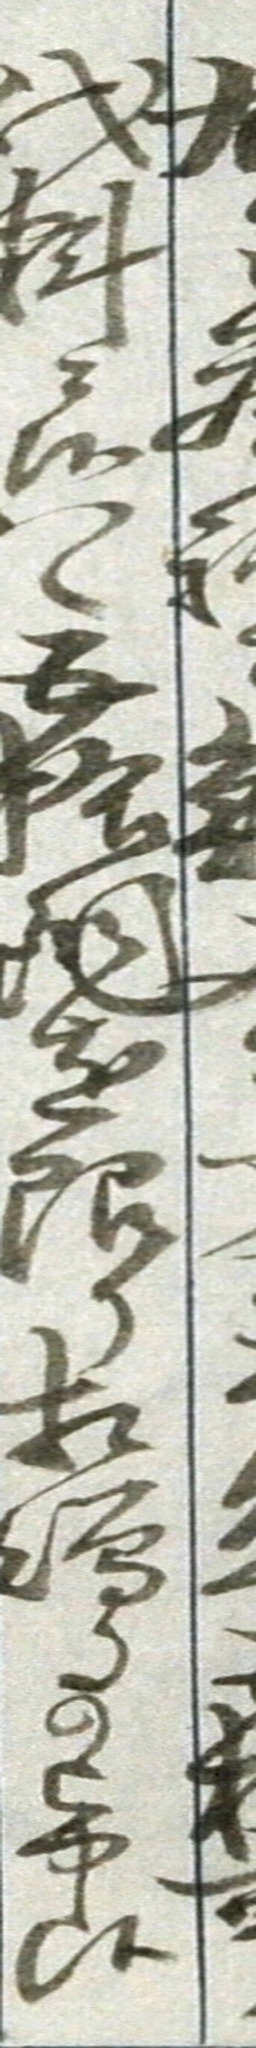代料ニ候はゝ五拾銅を限り相贈り可被申候
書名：御倹約被仰出書
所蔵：伊那市立高遠町図書館・合同会社AMANE
